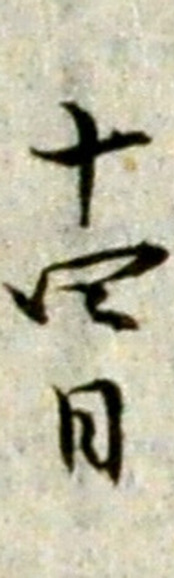十四日
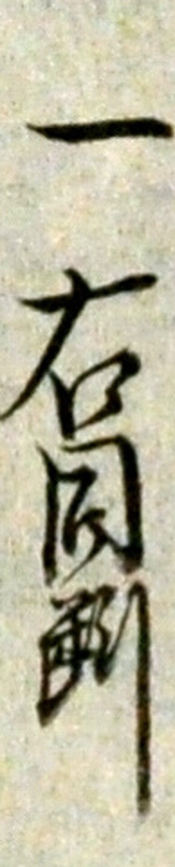一右同断
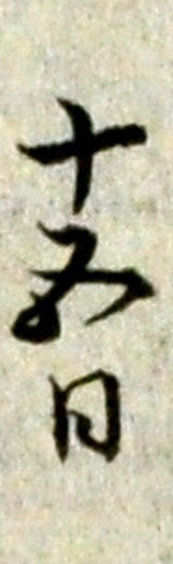十五日
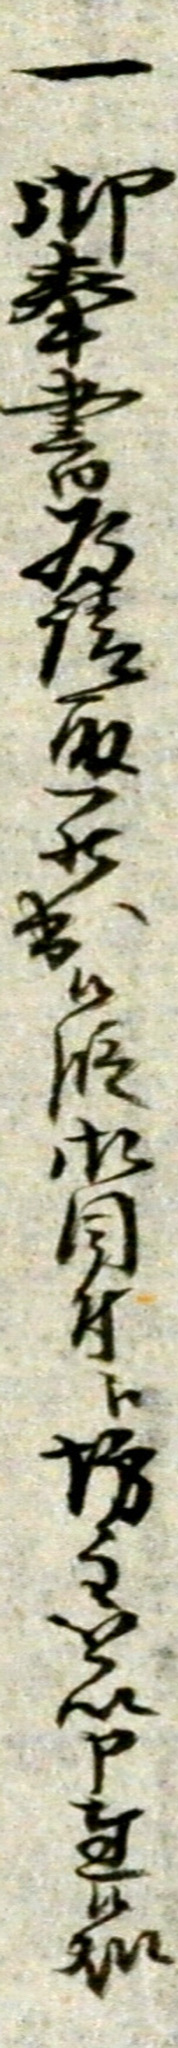一御奉書為請取罷出候段御目付江坊主を以申達候処
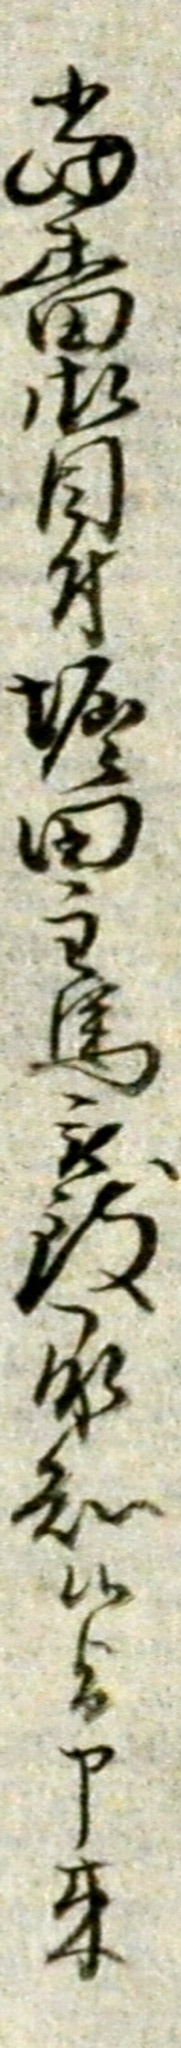当番御目付堀田主馬被致承知候旨申来
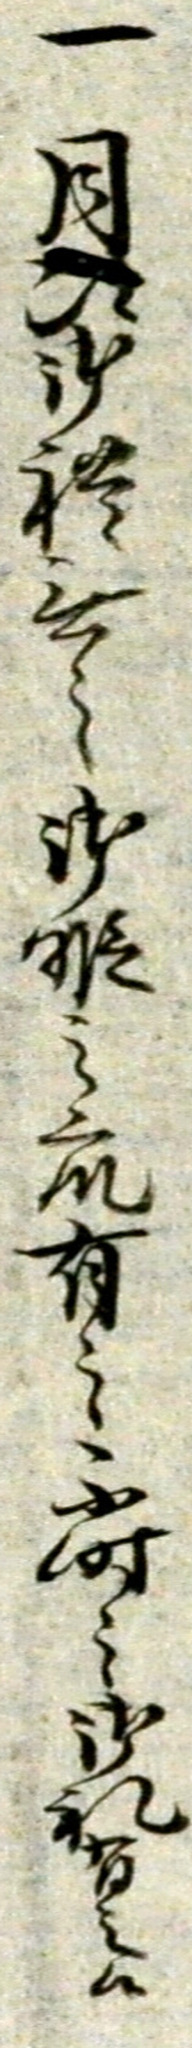一月〆御礼無之御暇之衆有之不時之御礼有之候
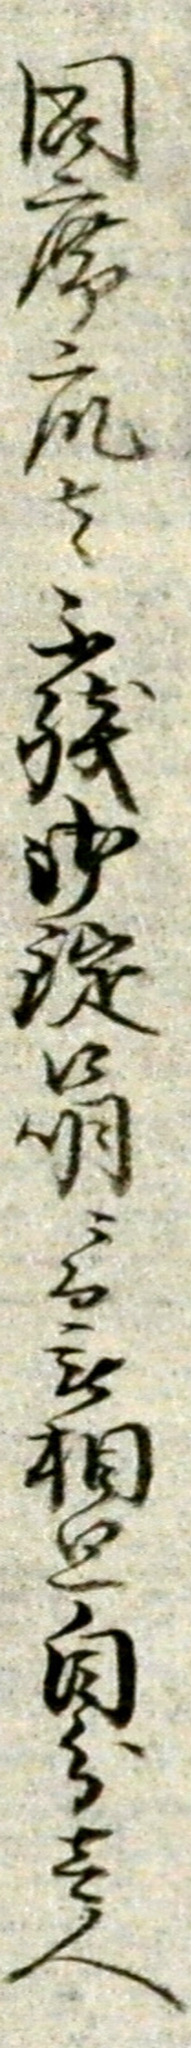同席衆者不残御錠口明ニ而被相廻自分壱人
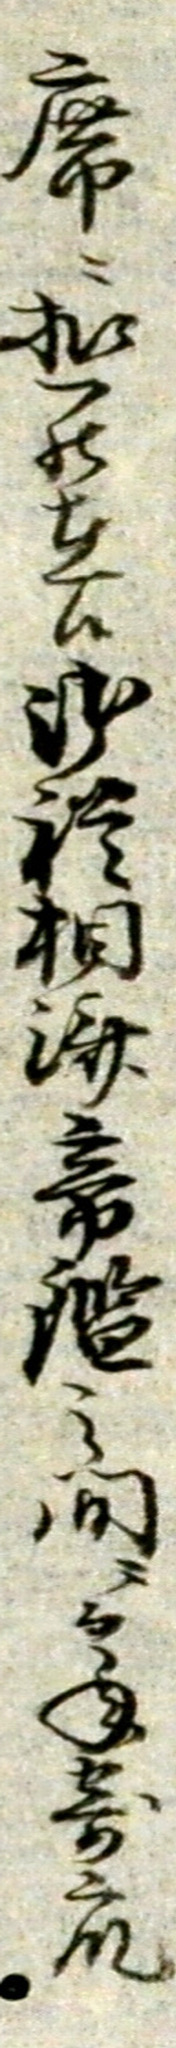席ニ扣罷在候御礼相済帝鑑之間ニ而年寄衆
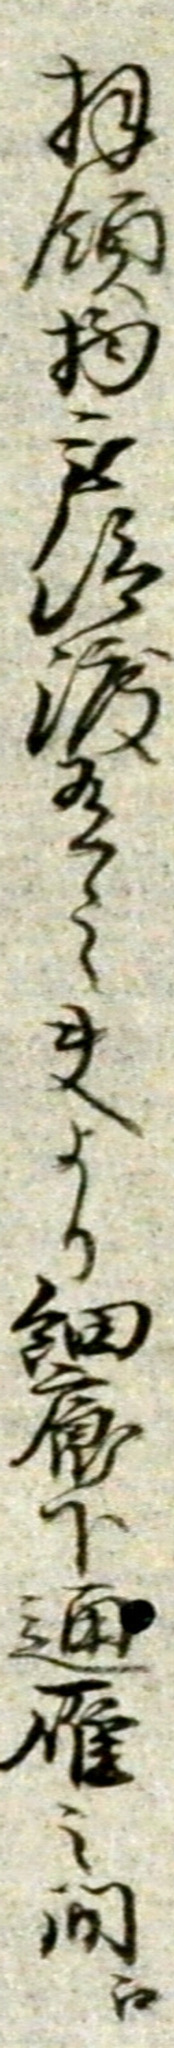拝領物被仰渡有之夫より細廊下通雁之間江
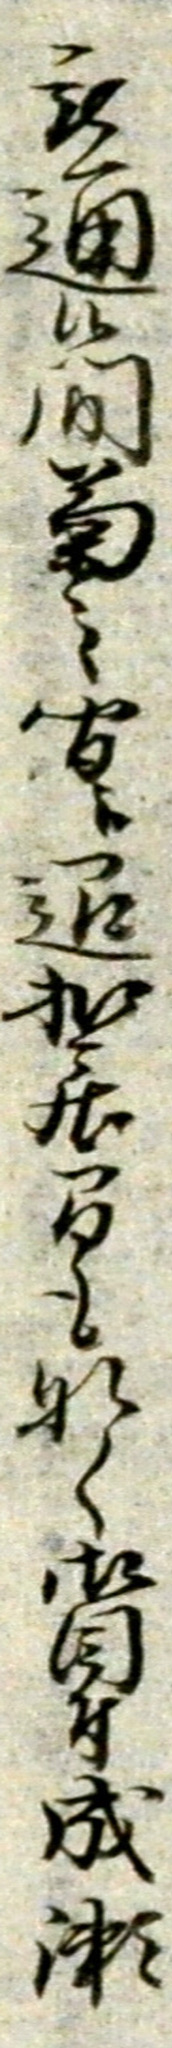被通候間菊之間江退扣居間もなく御目付成瀬
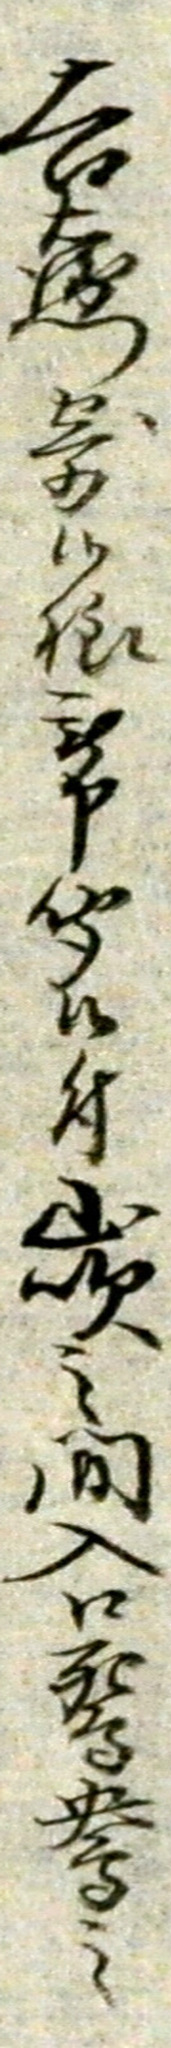吉右衛門寄候様被申聞候付山吹之間入口鷹鶯之
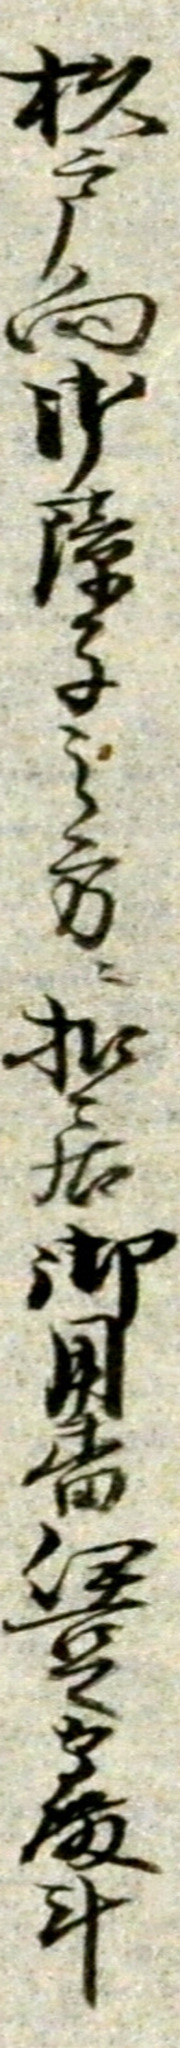杉戸向御障子之方ニ扣居御用番伊豆守殿計
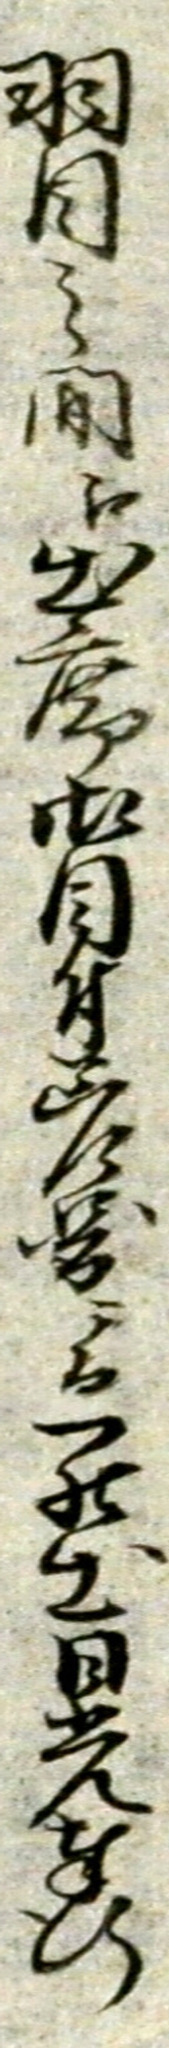羽目之間江出席御目付差図ニ而罷出日光奉行
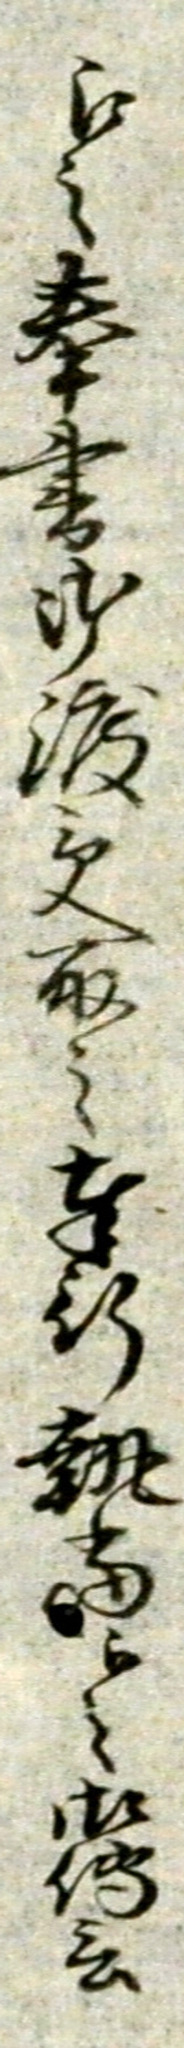江之奉書御渡受取之奉行執当江之御伝言
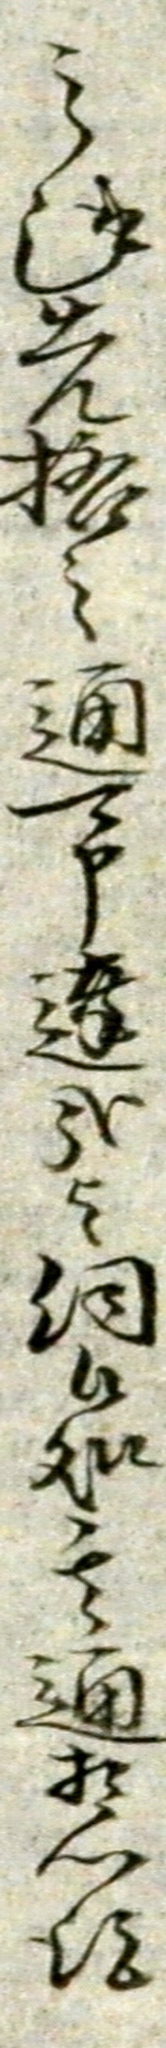之趣先格之通可申達哉と伺候処其通相心得
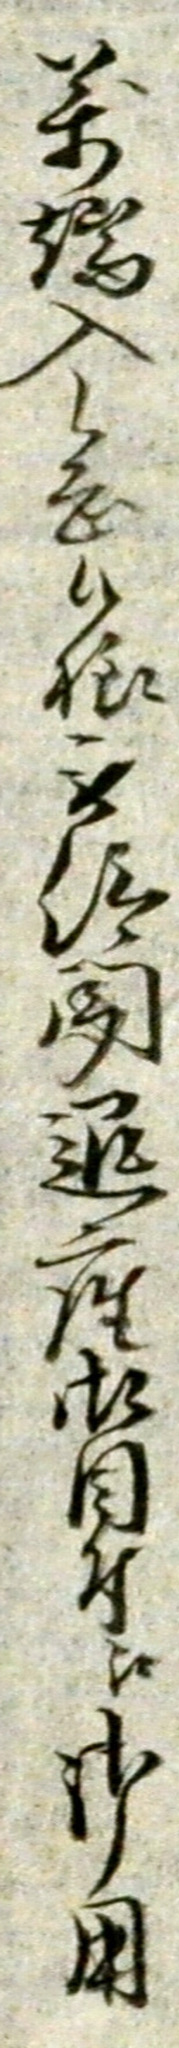万端入之念候様被仰聞退座御目付江御用
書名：日光御名代相勤候節ノ留
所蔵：伊那市立高遠町図書館・合同会社AMANE
